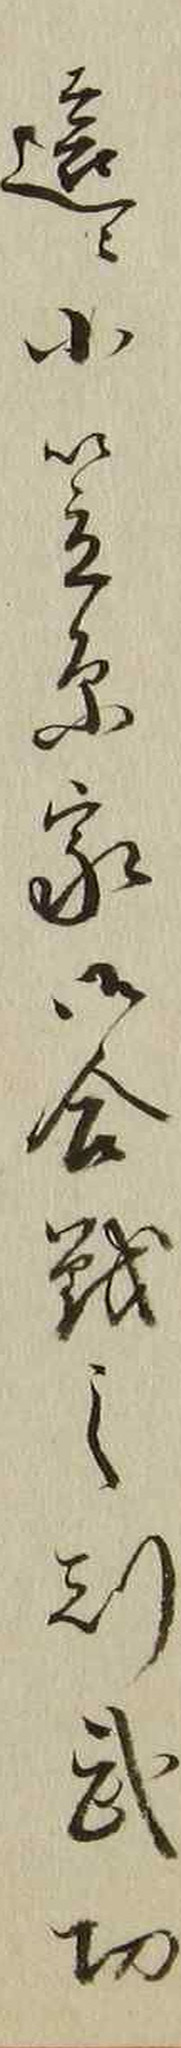遠ニ小笠原家御合戦之刻武功
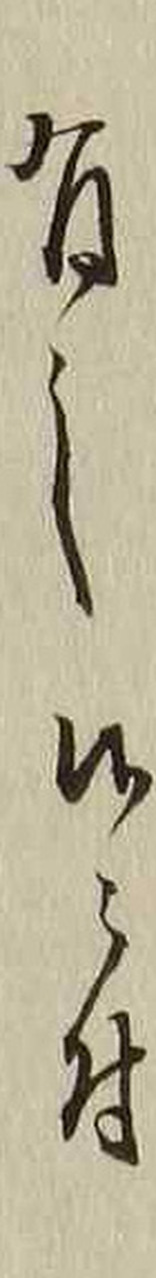有之候ニ付
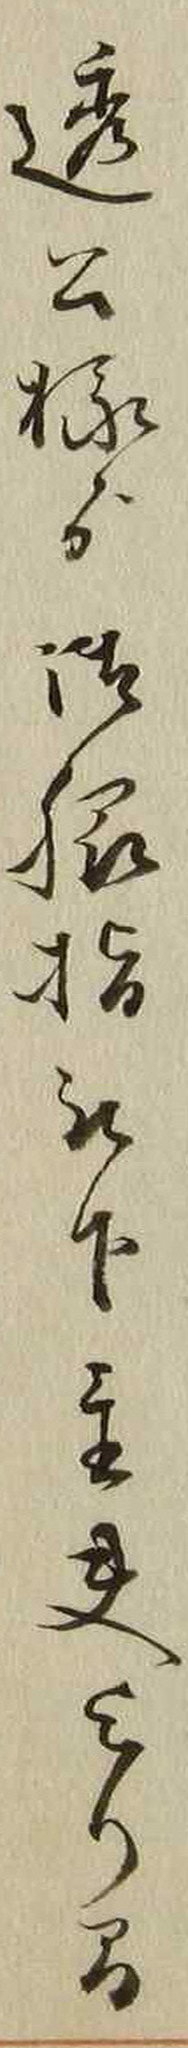透公様ゟ御脇指被下置夫より間
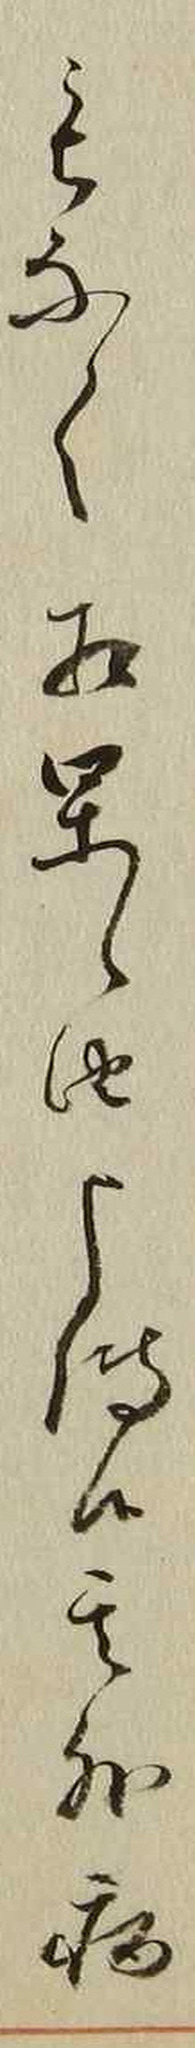もなく相果候由申伝候其外病
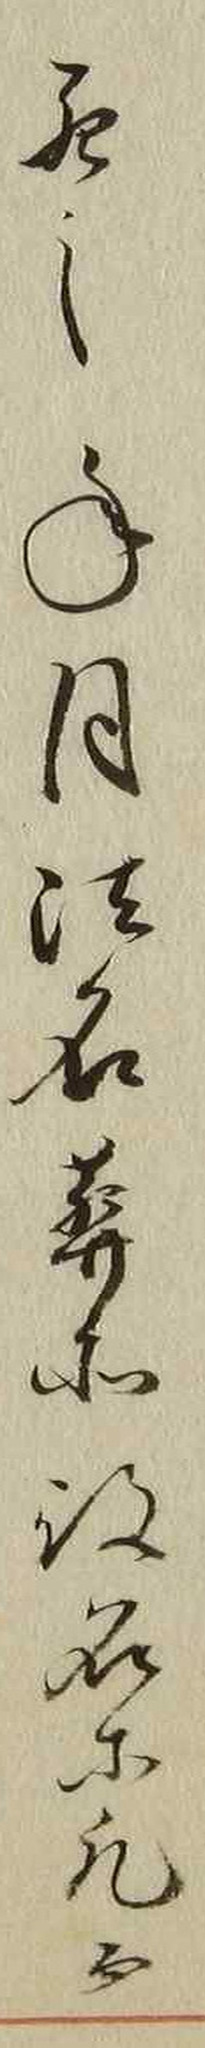死之年月法名葬所役名等凡而
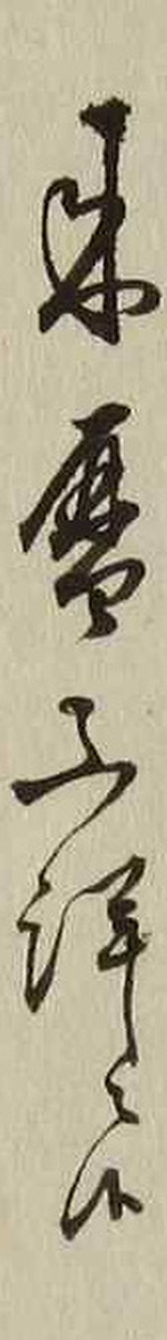来歴不詳ニ候
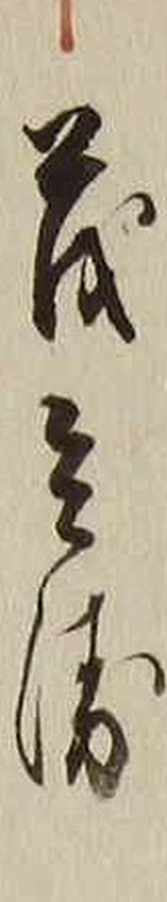茂兵衛
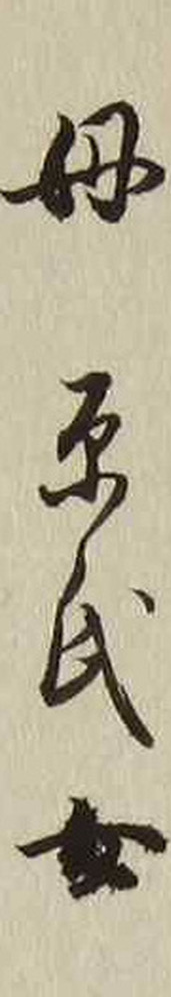母原氏女
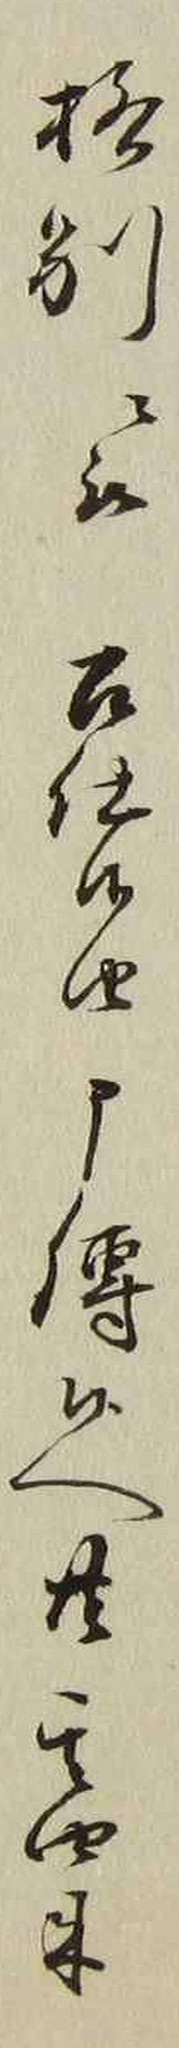格別ニ被召仕候由申伝候へ共其由来
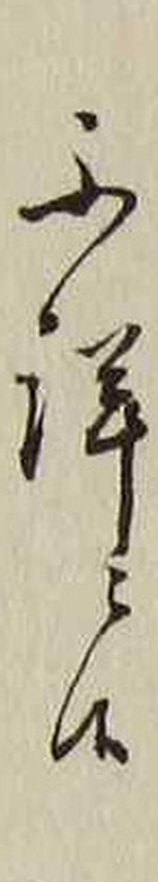不詳ニ候
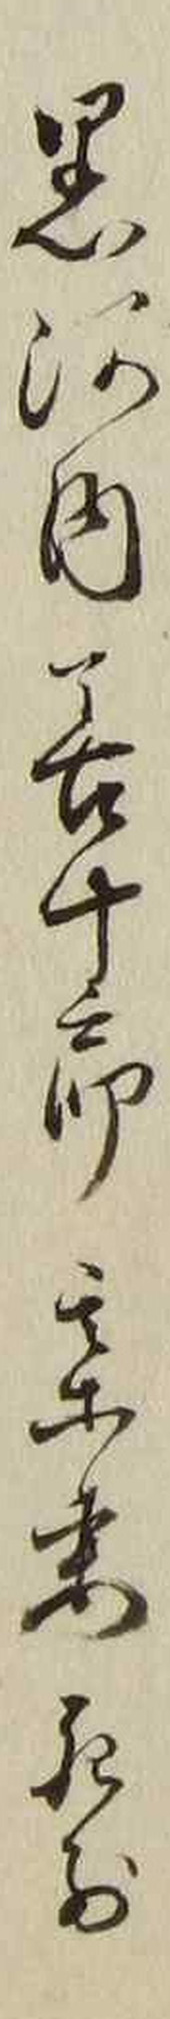女黒河内善十郎某妻死別

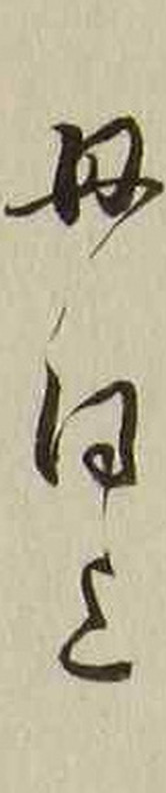母同上
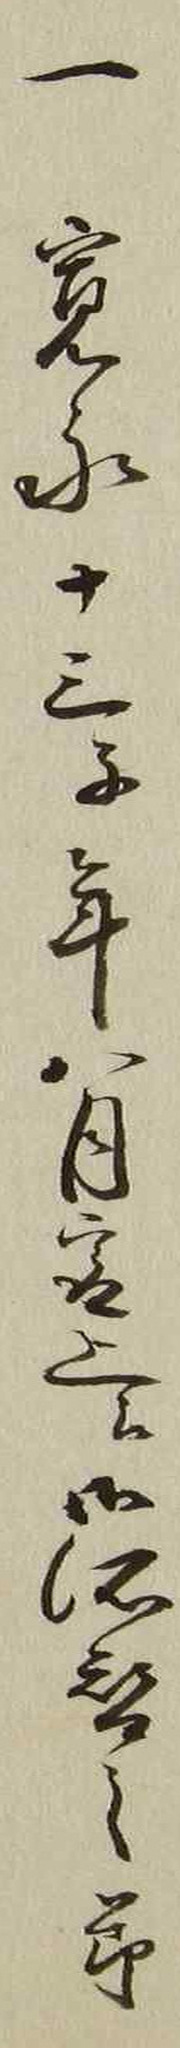一寛永十三子年八月最上江御所替之節
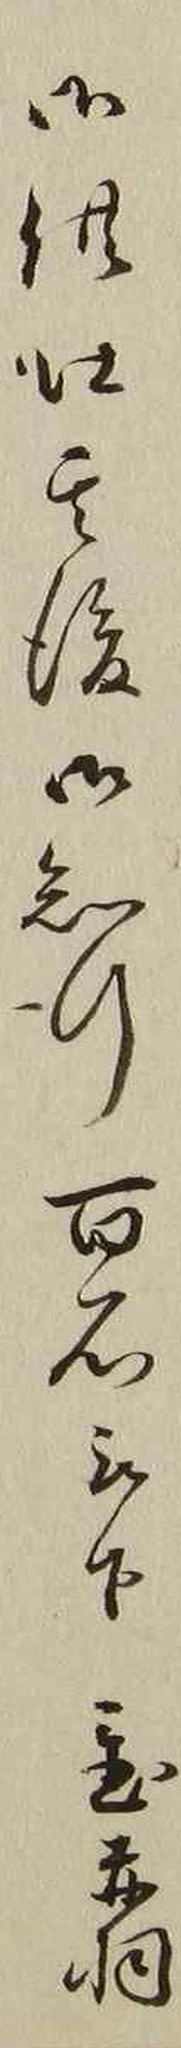御供仕其後御知行百石被下置赤羽
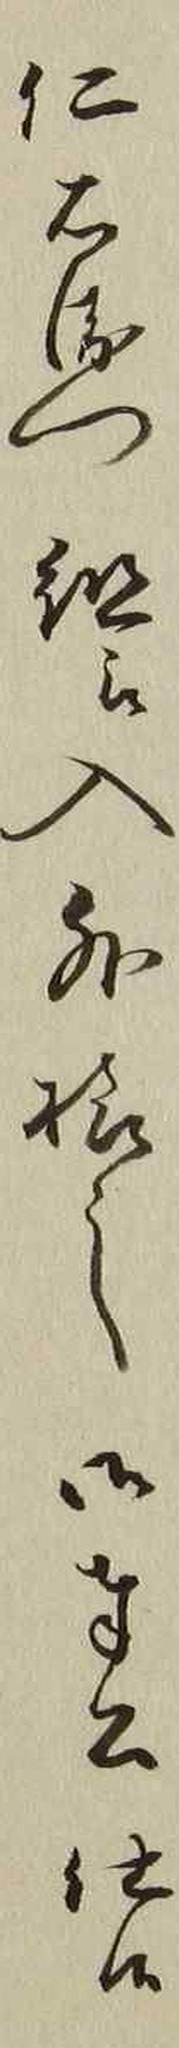仁右衛門組江入外様之御奉公仕候
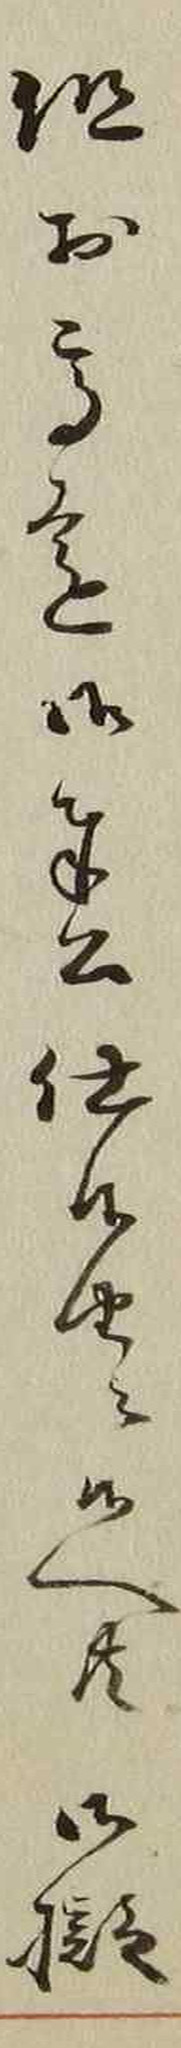但於高遠御奉公仕候由ニ候へ共御擬
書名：諸士系譜　巻之26　い之部26
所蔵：会津若松市立会津図書館
